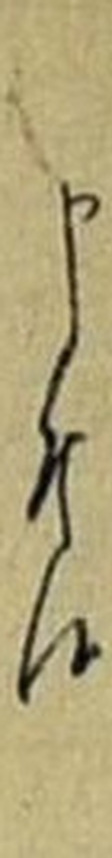申付候
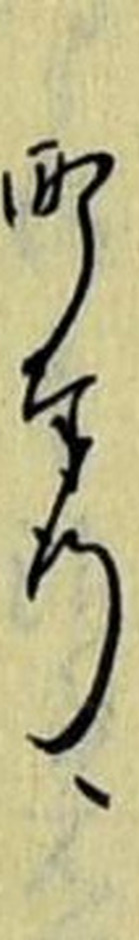御奉行
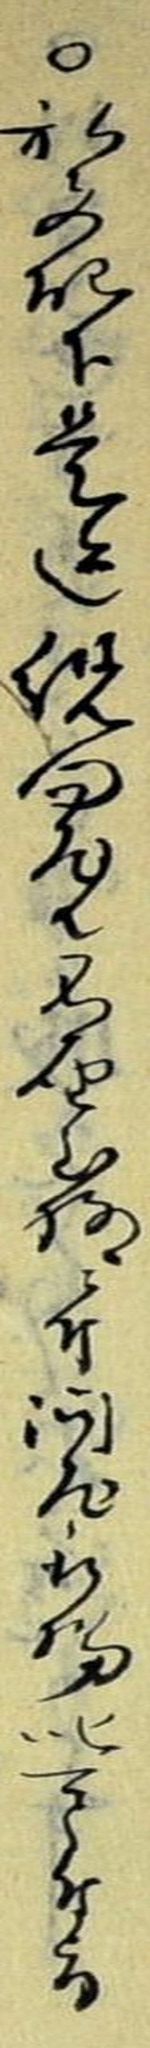○於支配下是迄繭問屋共不届至極に付問屋取揚叱可申旨
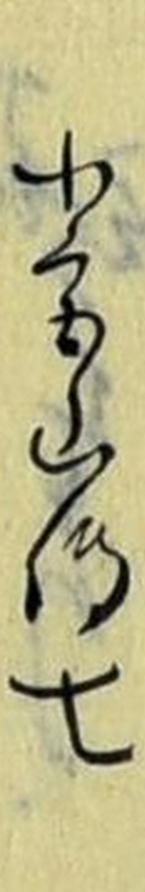小宮山伝七
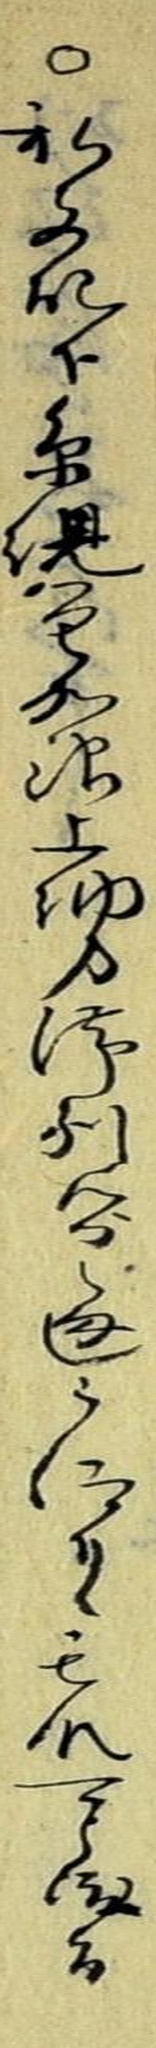○於支配下糸繭冥加銀上納方滞別紙之通被仰付候其段可申渡旨
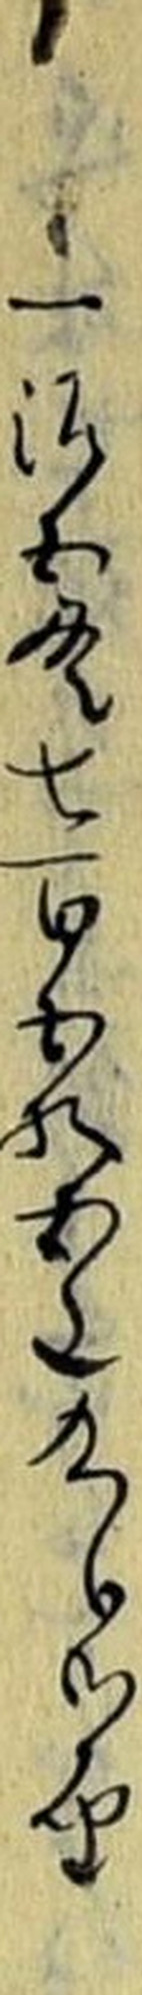一銀五貫七百五拾五匁九分弐厘
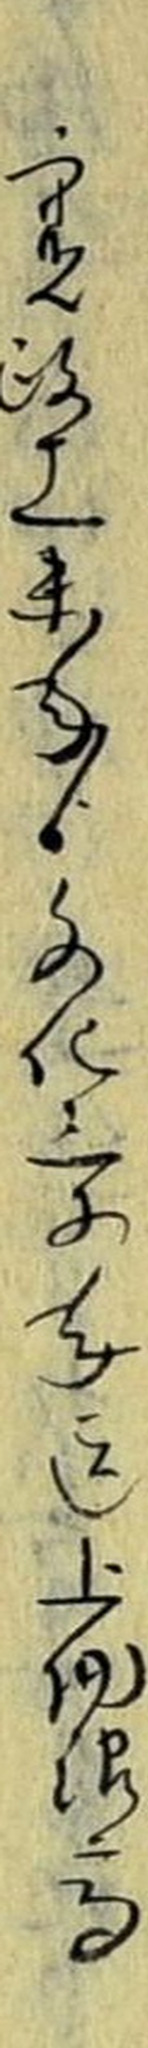寛政十一未年ゟ文化三子年迄上納銀高
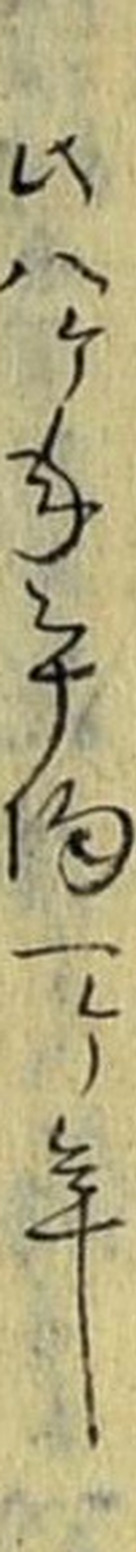此八ヶ年平均一ヶ年
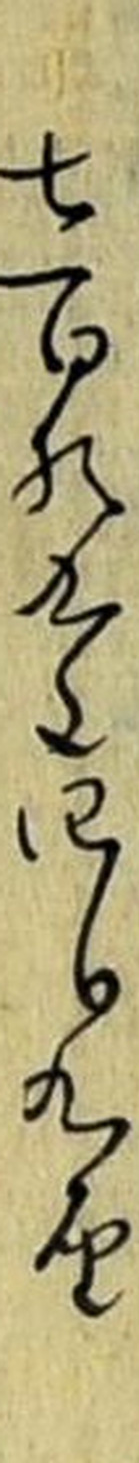七百拾九匁四分九厘
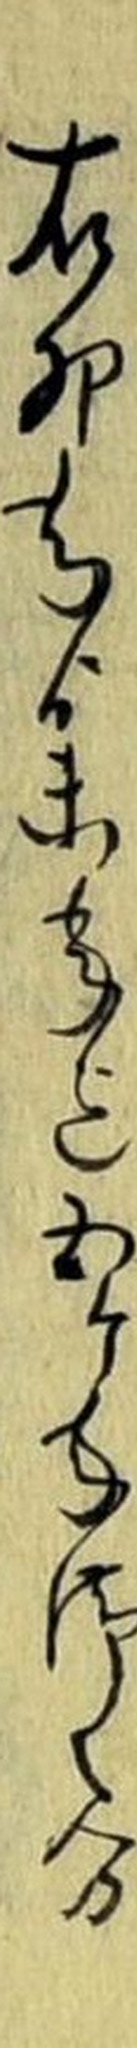右卯年ゟ未年迄五ヶ年滞之分
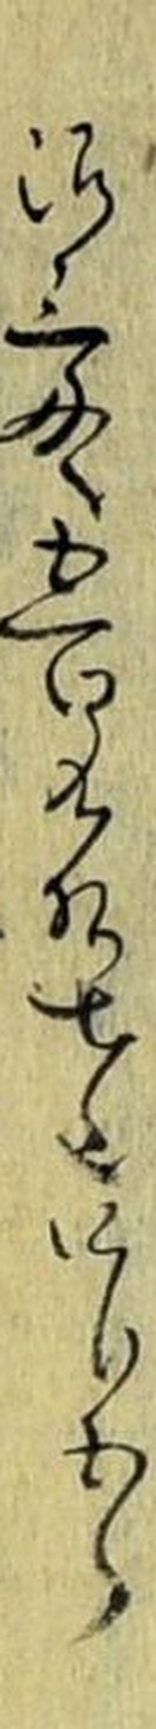銀三貫五百九拾七匁四分五厘
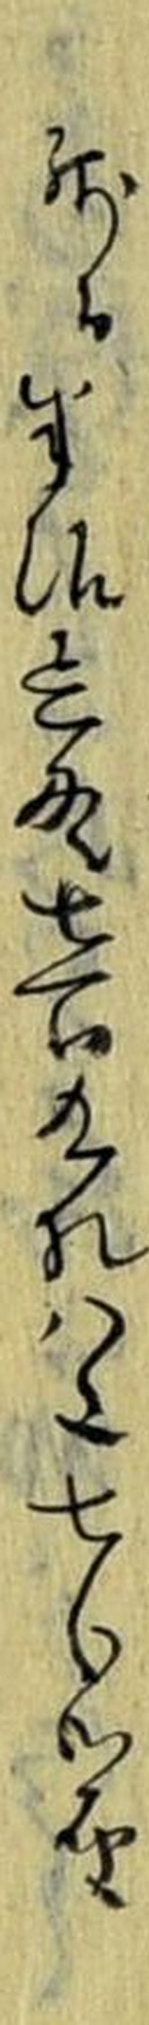残而半銀壱貫七百九拾八匁七分弐厘

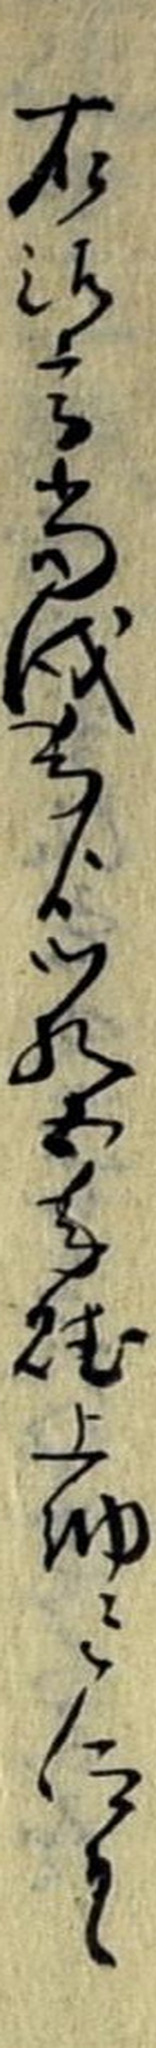右銀高当戌年ゟ弐拾五年賦上納に被仰付候
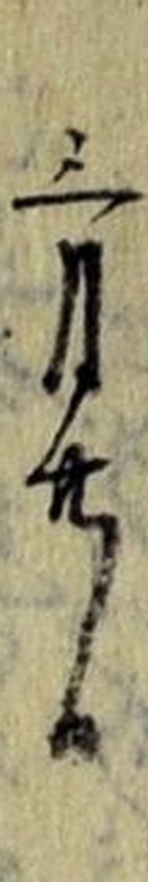三月廿日
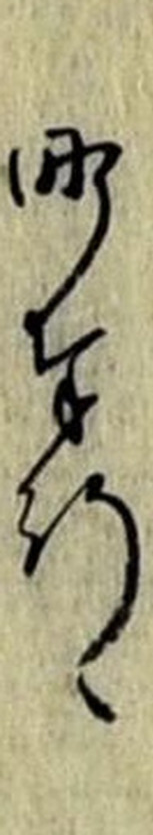御奉行へ
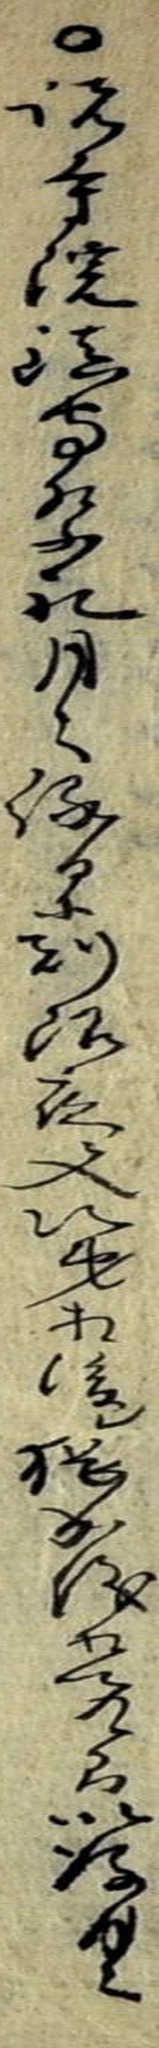○諸寺院鎮守祭礼月々縁日等刻限夜に入次第相後レ猥成儀相聞候間以後月々
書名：命令之部 四
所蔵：福井県文書館 Fukui Prefectural Archives
